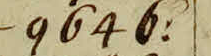9646:
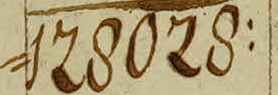128028
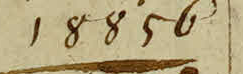18856
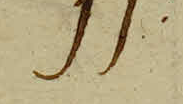11
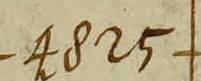4825
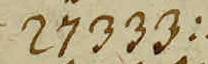27333
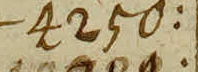4250
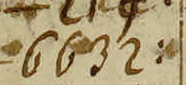6632
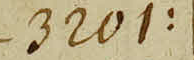3201
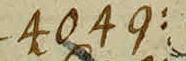4049
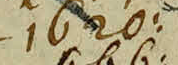1620
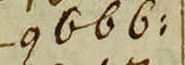9666
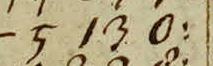5130
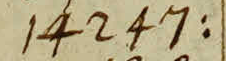14247
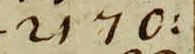2170
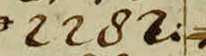2282
